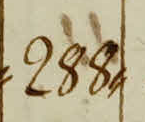288
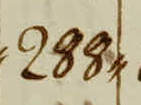288
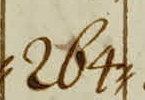264
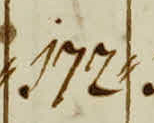172
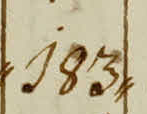183
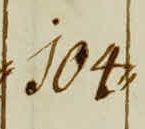104
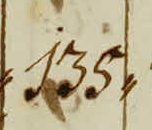135
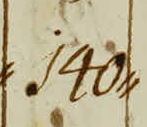140
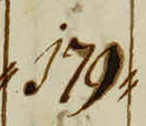179
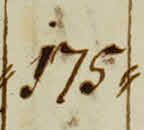175
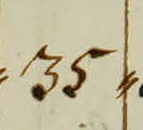35
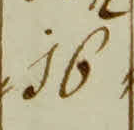16
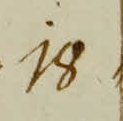18
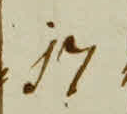17
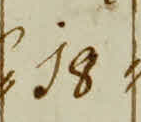18
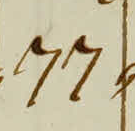77
